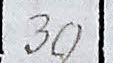39
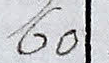60
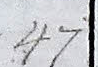47
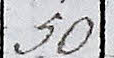50
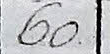60
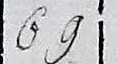69
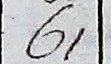61
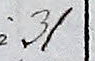31
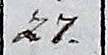27.
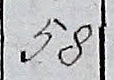58
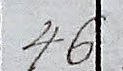46
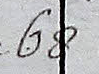68
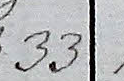33
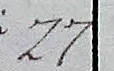27
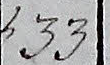33
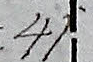41
